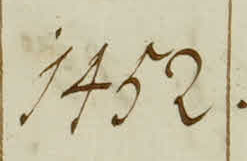1452
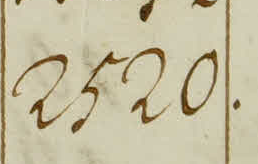2520
